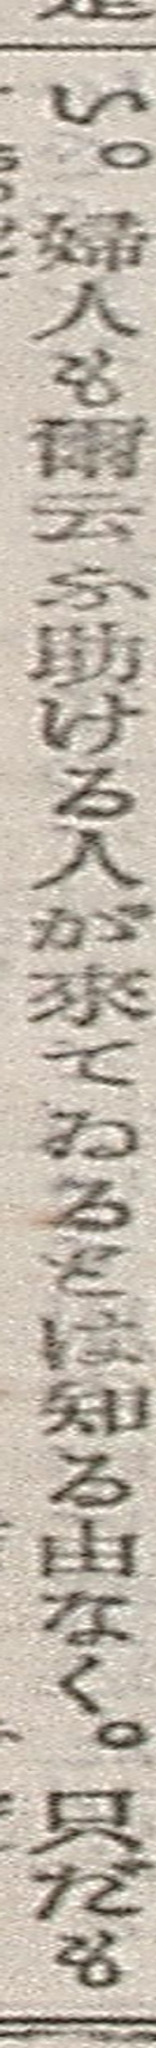い。婦人も爾云ふ助ける人が来てゐるとは知る由なく。只だも
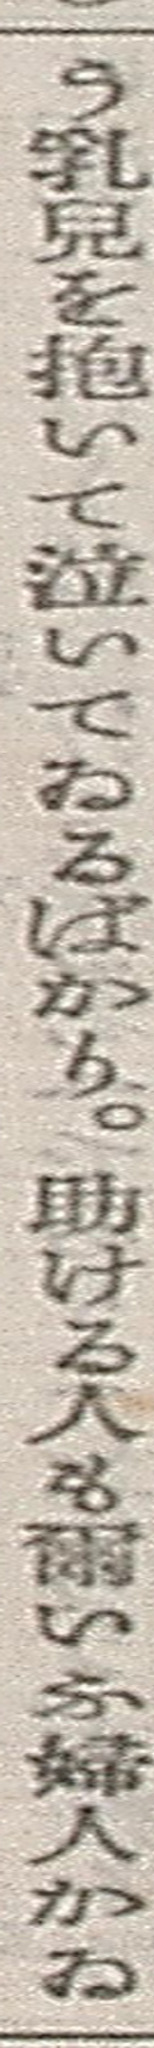う乳児を抱いて泣いてゐるばかり。助ける人も爾いふ婦人かゐ
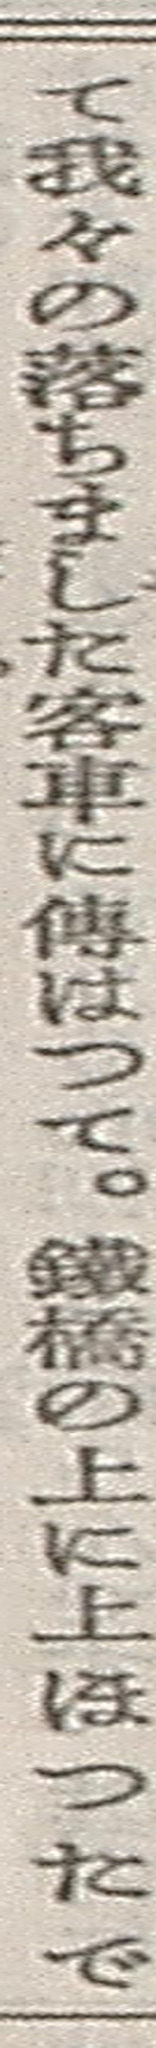て我々の落ちました客車に伝はつて。鉄橋の上に上ほつたで
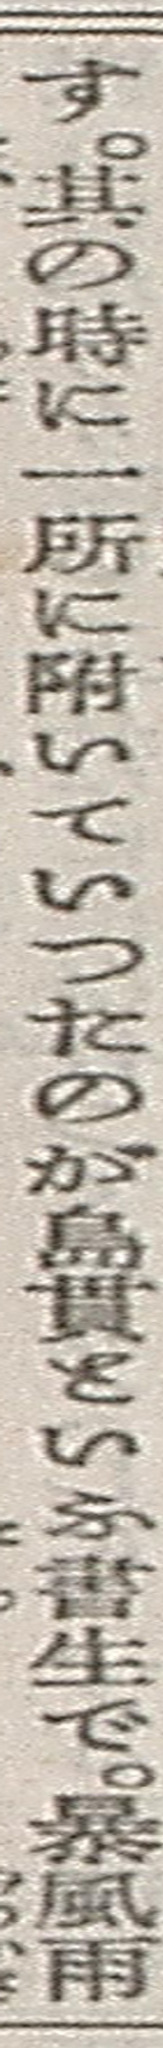す。其の時に一所に附いていつたのが島貫といふ書生で。暴風雨
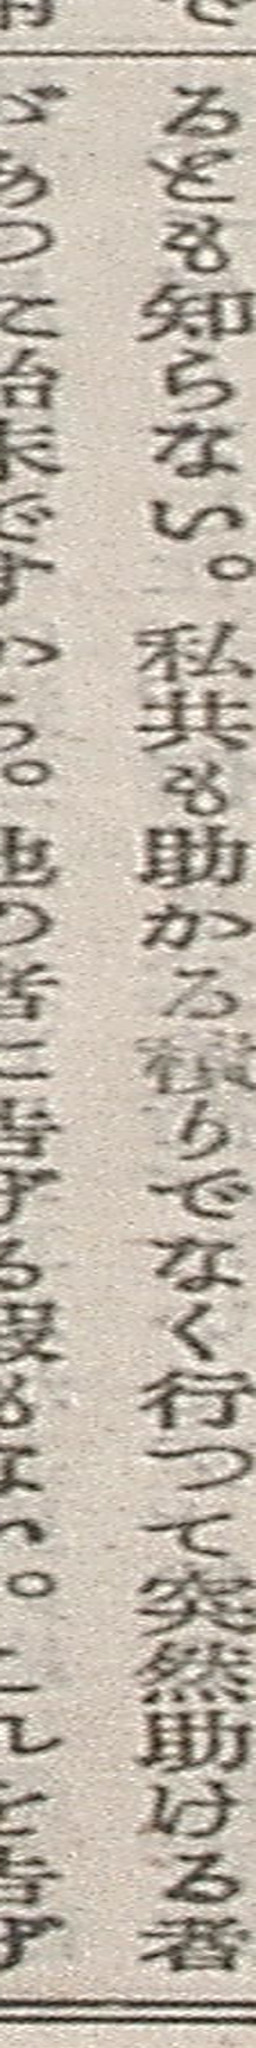があつた始末ですから。他の者に告げる暇もない。これを告げ
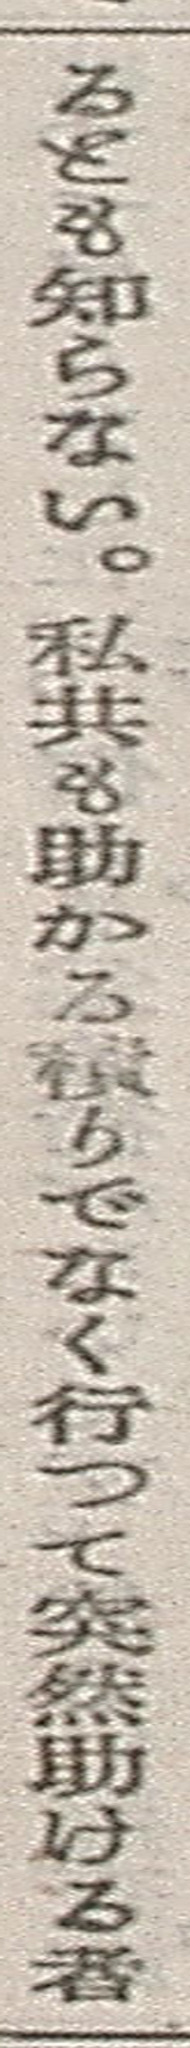るとも知らない。私共も助かる積りでなく行つて突然助ける者
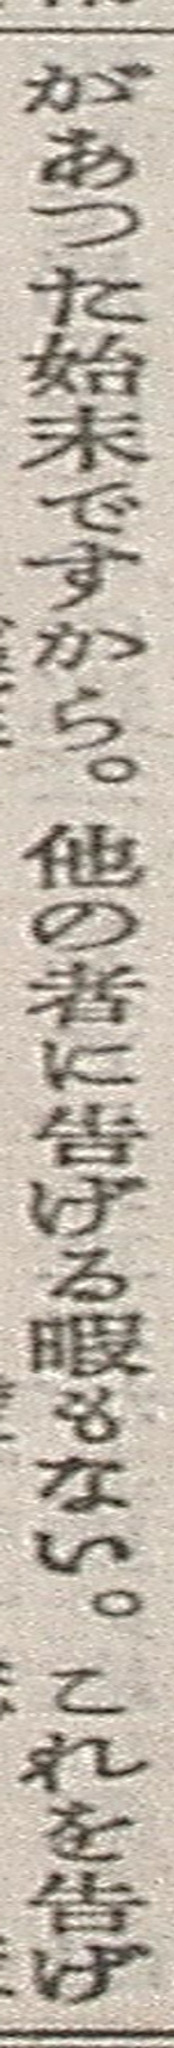があつた始末ですから。他の者に告げる暇もない。これを告げ
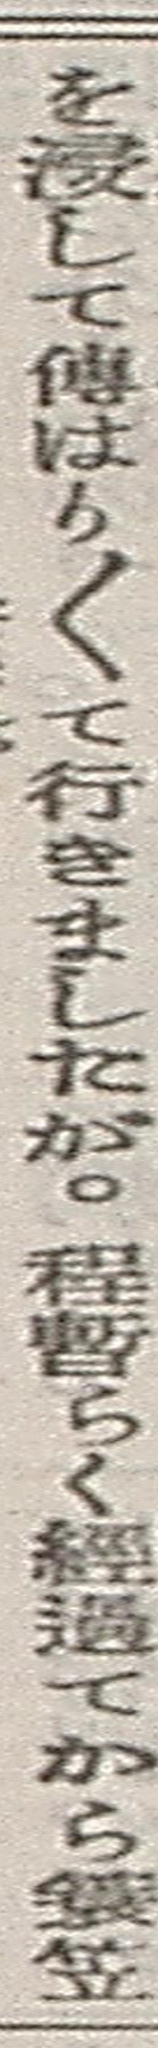を浸して伝はり〳〵て行きましたが。程暫らく経過てから蓑笠
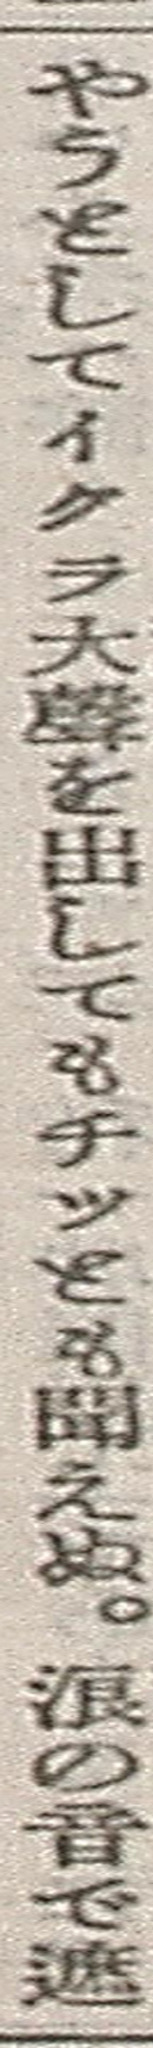やうとしてイクラ大声を出してもチツとも聞えぬ。浪の音で遮
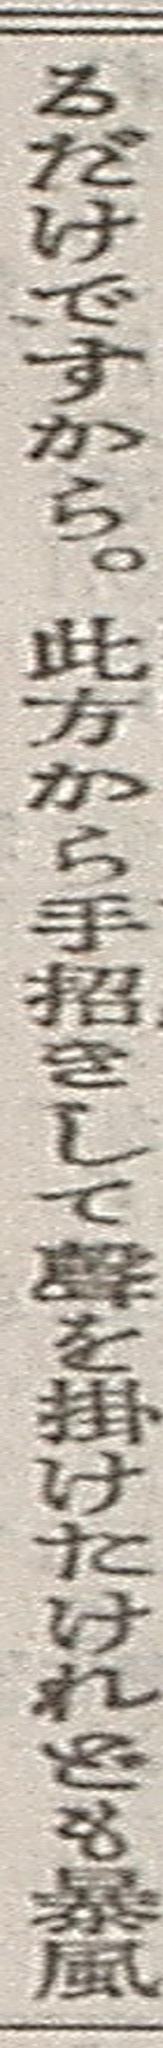るだけですから。此方から手招きして声を掛けたけれども暴風
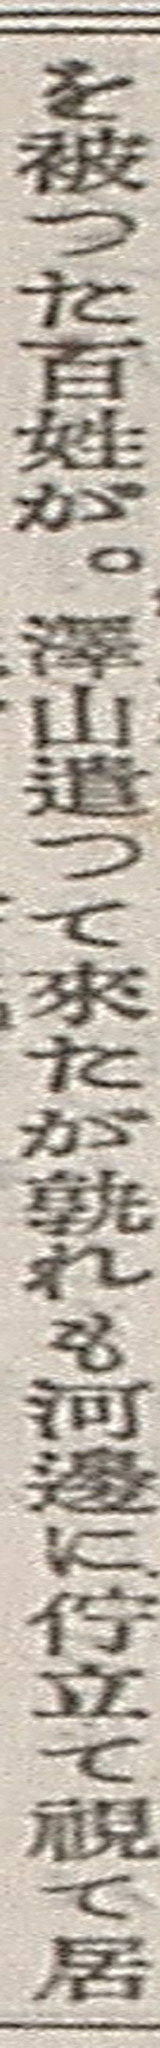を被つた百姓が。沢山遣つて来たが孰れも河辺に佇立て視て居
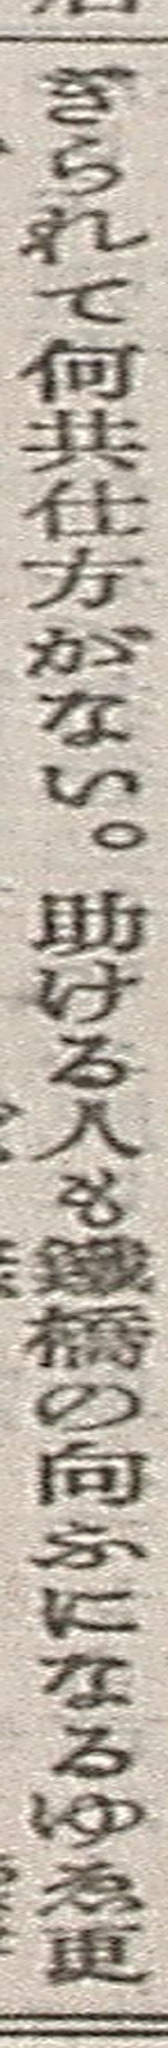ぎられて何共仕方がない。助ける人も鉄橋の向ふになるゆゑ更
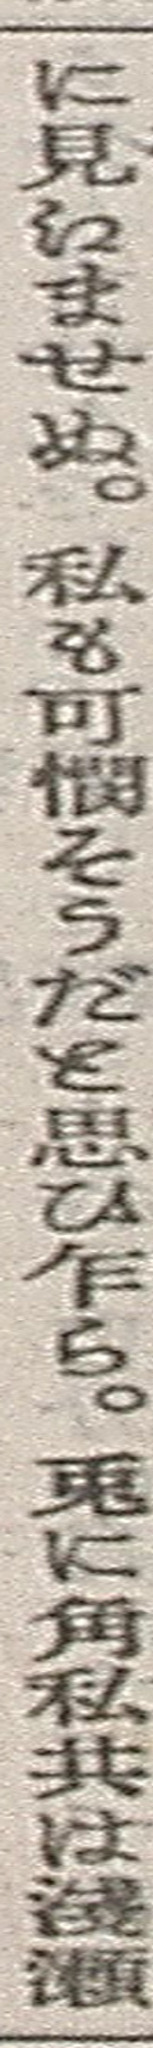に見えませぬ。私も可憫そうだと思ひ乍ら。兎に角私共は浅瀬
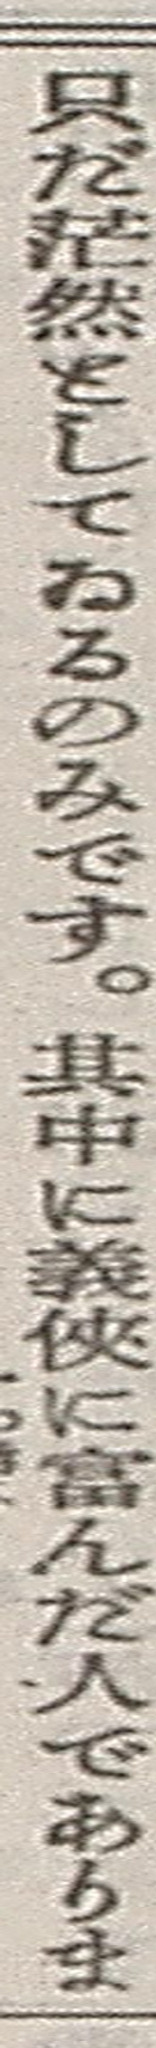只だ茫然としてゐるのみです。其中に義侠に富んだ人でありま
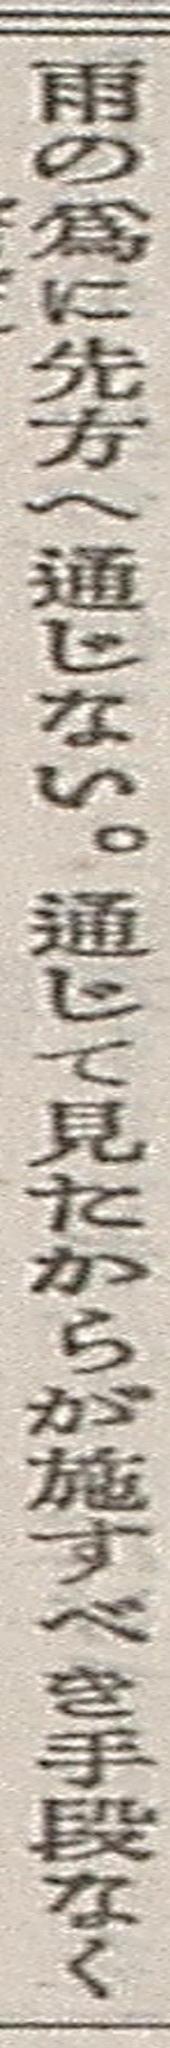雨の為に先方へ通じない。通じて見たからが施すべき手段なく
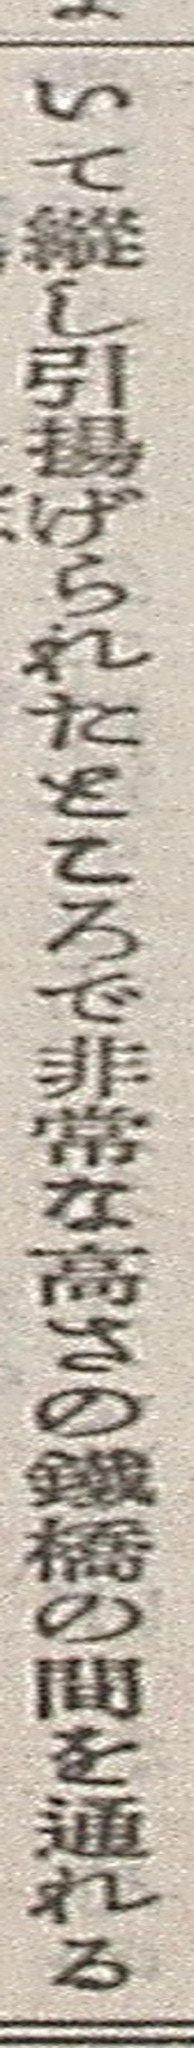いて縦し引揚げられたところで非常な高さの鉄橋の間を通れる
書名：風俗畫報臨時増刊第百九十九號　明治三十二年十月各地災害圖會（前編之續）
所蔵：東京大学地震研究所図書室 Earthquake Research Institute Library, The University of Tokyo, JAPAN
